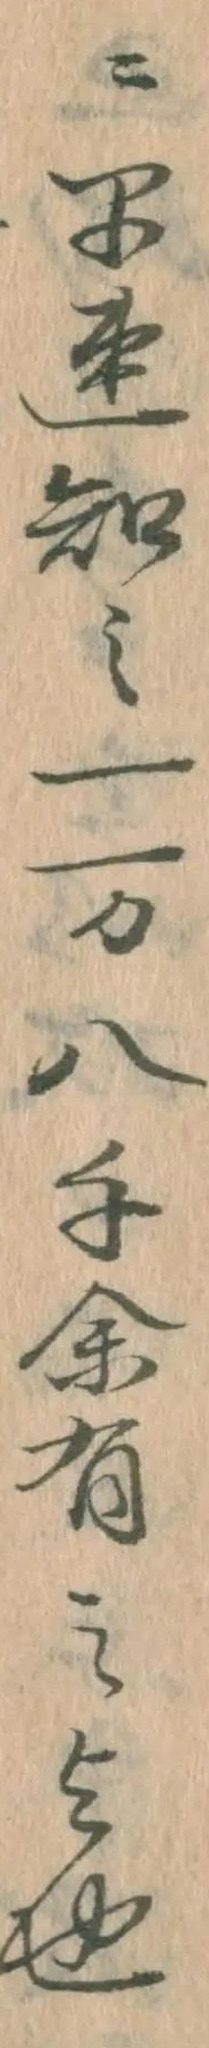に早速知之一万八千余有之与也
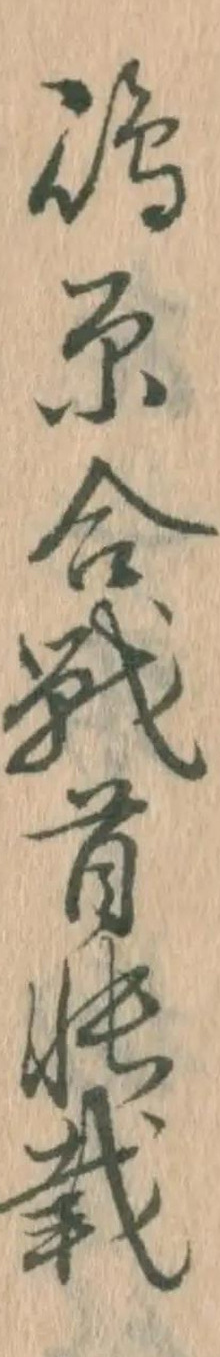島原合戦首帳載
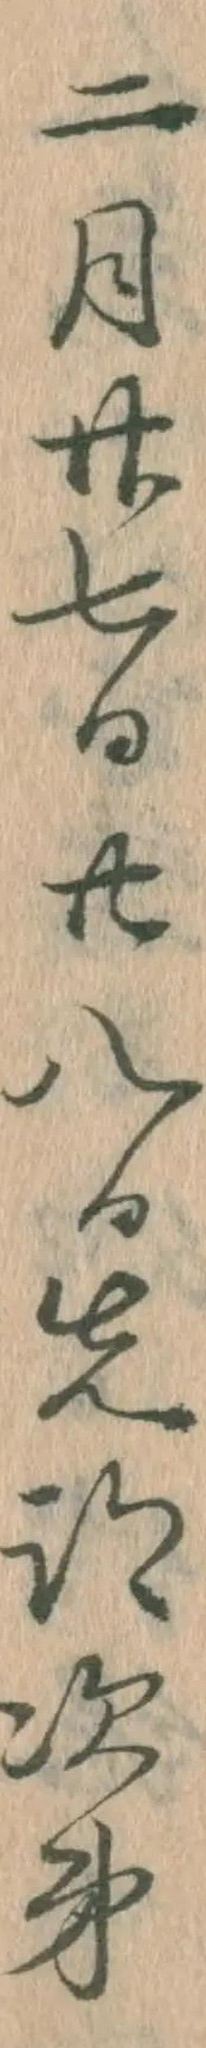二月廿七日廿八日先跡次第
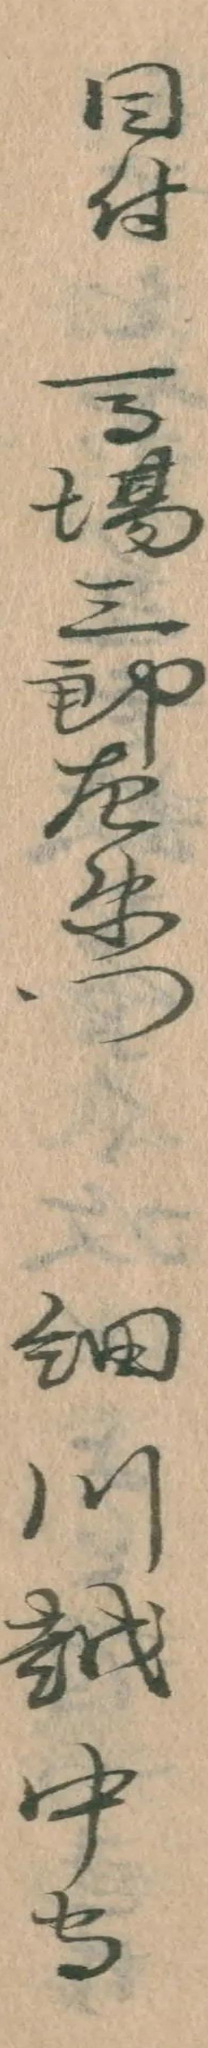日付馬場三郎左衛門細川越中守
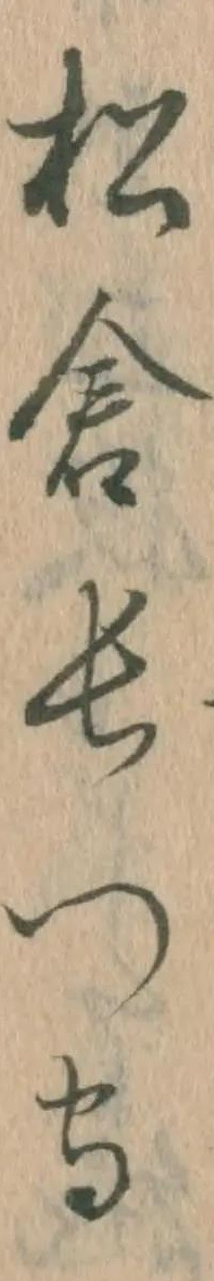松倉長門守
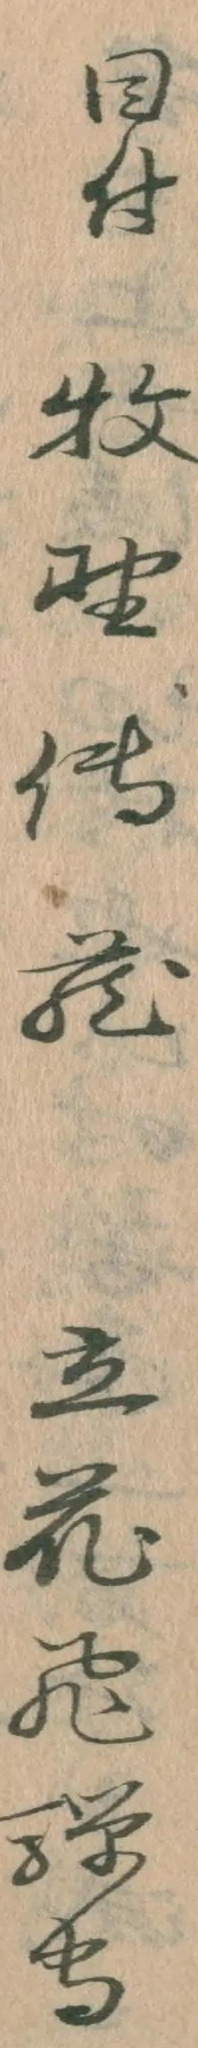日付牧野伝蔵立花飛騨守
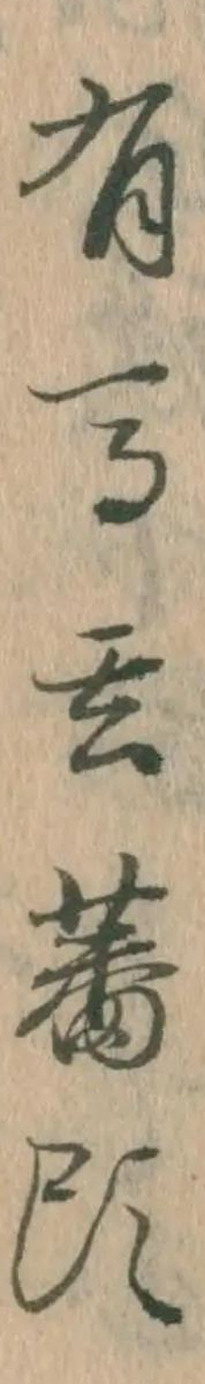有馬玄蕃頭
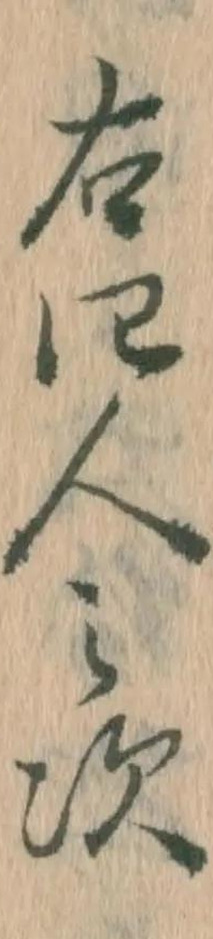右四人之次
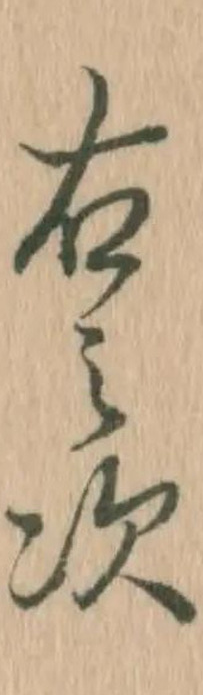右之次
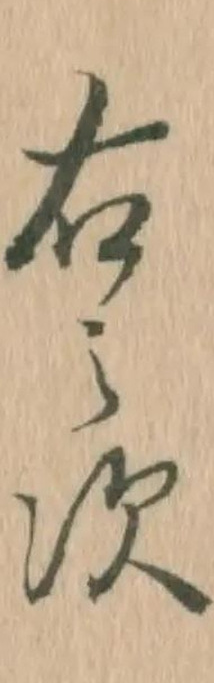右之次
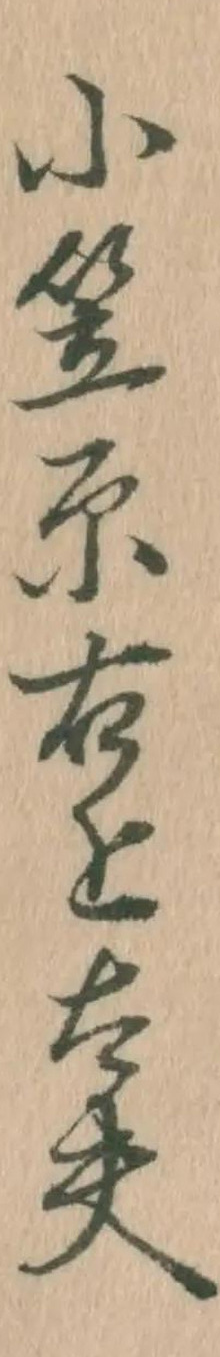小笠原右近太夫
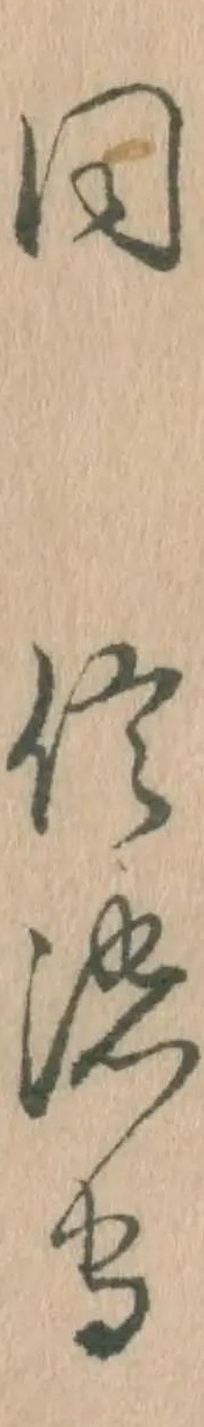同信濃守
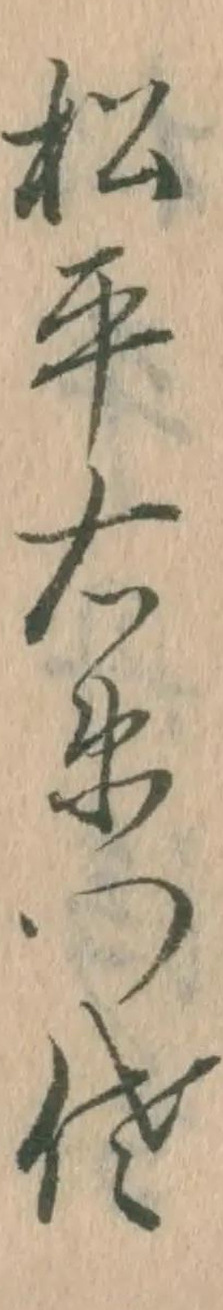松平右衛門佐
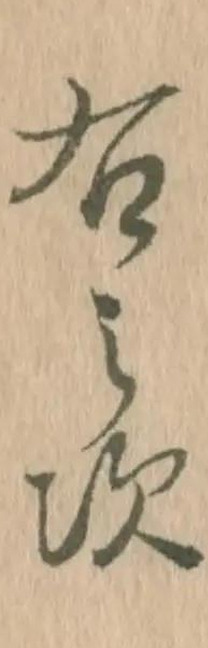右之次
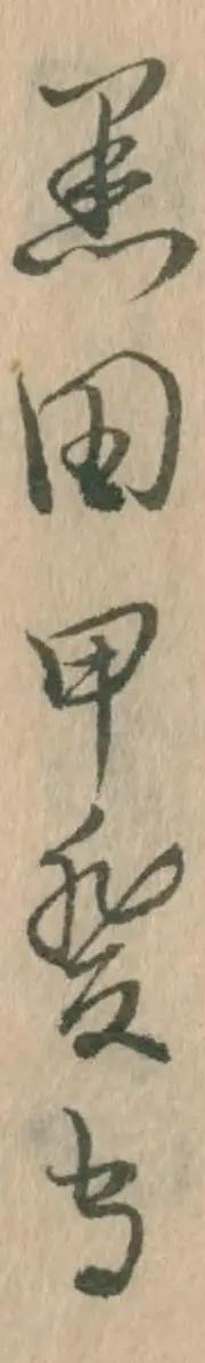黒田甲斐守

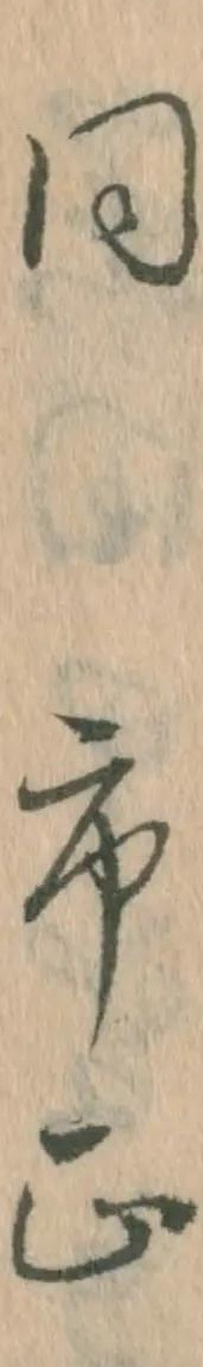同市正
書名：切支丹御退治記 49巻. [7]
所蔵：国立国会図書館 National Diet Library, JAPAN
